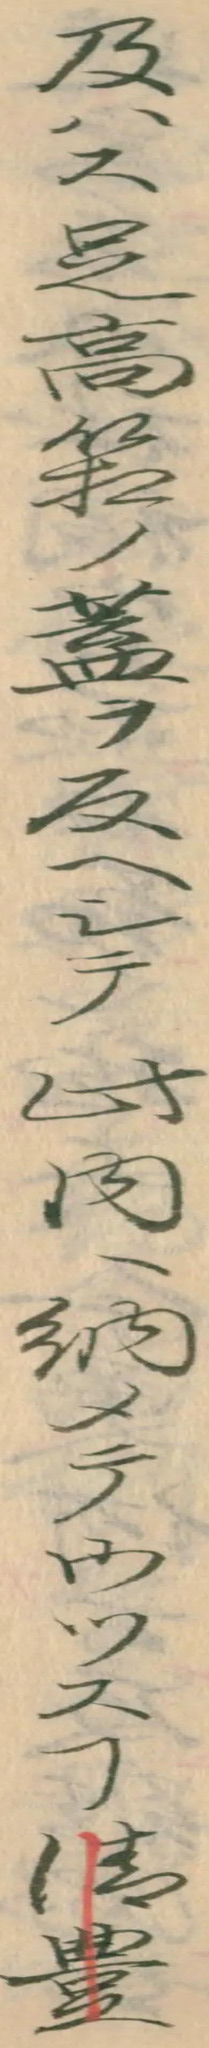及ハス足高箱ノ蓋ヲ反ヘシテ此内ヘ納メテウツスコト清豊
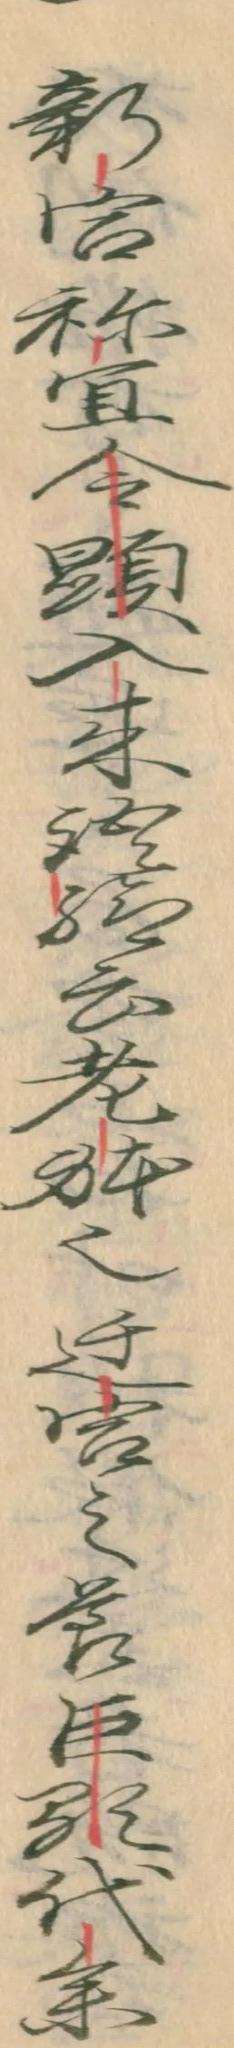一新-宮祢-宜令顕入-来語_給云老-体也迁-宮之節巨顕代-参
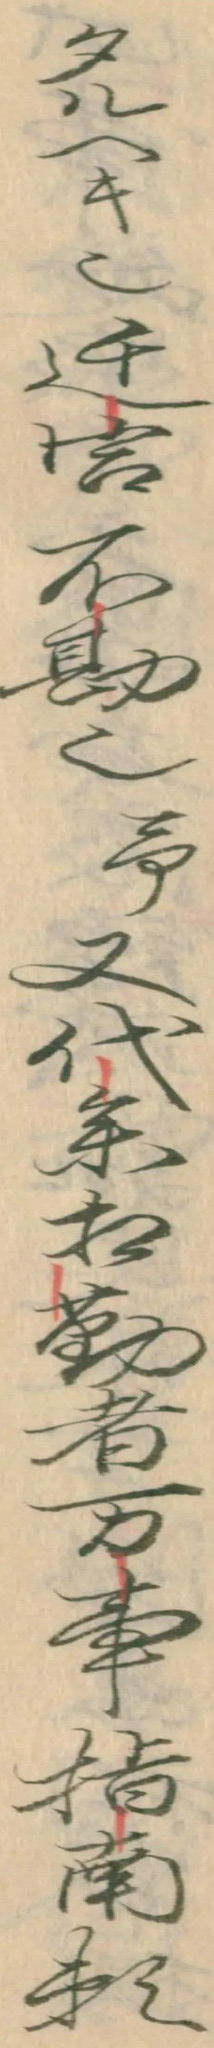タルヘキ也迁-宮不-勘也予又代-参相_勤者万-事指-南頼
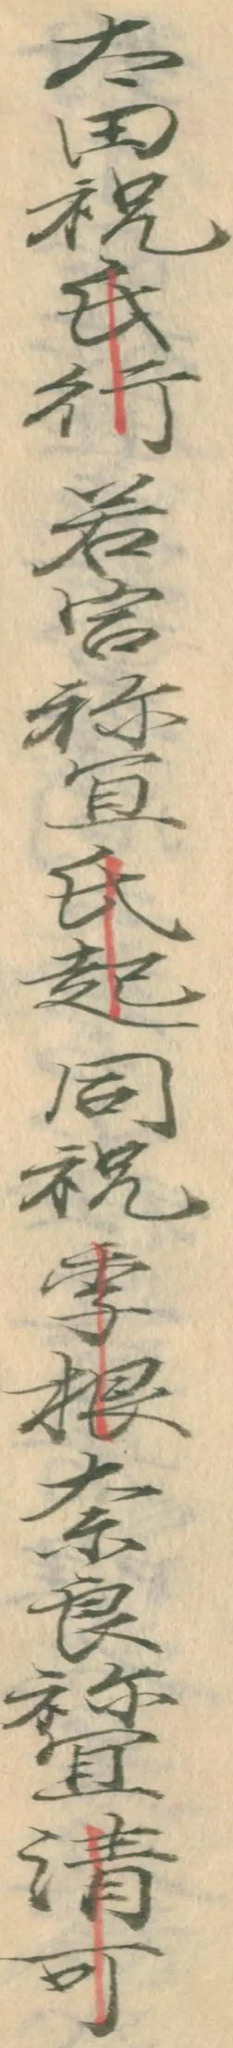太田祝氏行若宮祢宜氏起同祝季根奈良祢宜清可
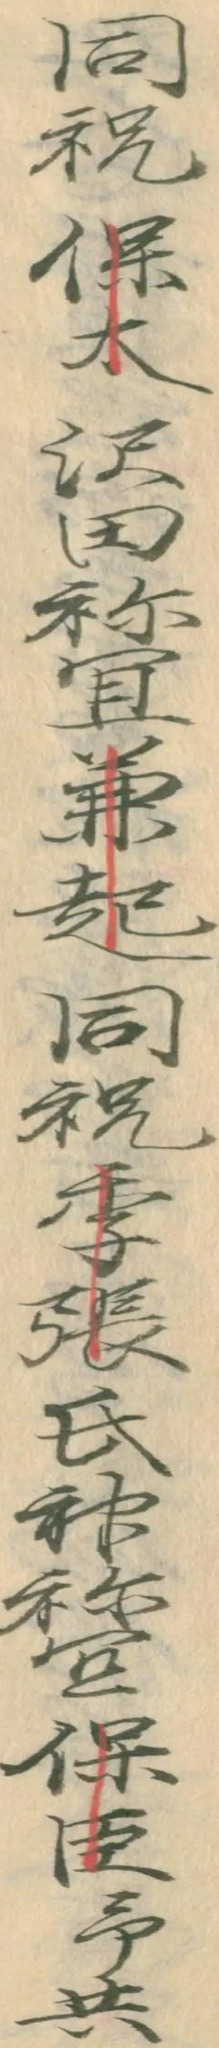同祝保太沢田祢宜兼起同祝季張氏神祢宜保臣予共

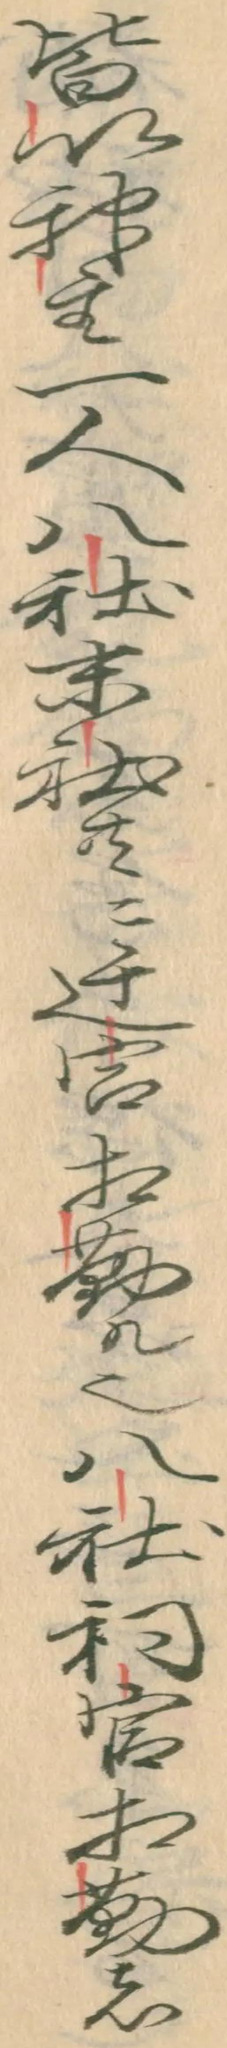皆_以神_主一人八-社末-社共ニ迁-宮相_勤ル也八-社祠-官相_勤者
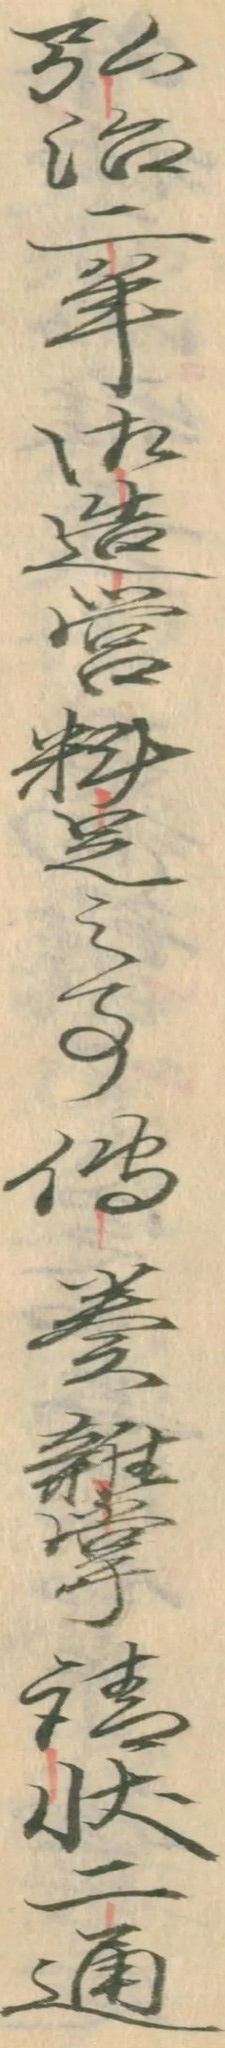弘-治二-年御-造-営料-足之事伝-奏雑-掌請_状二-通

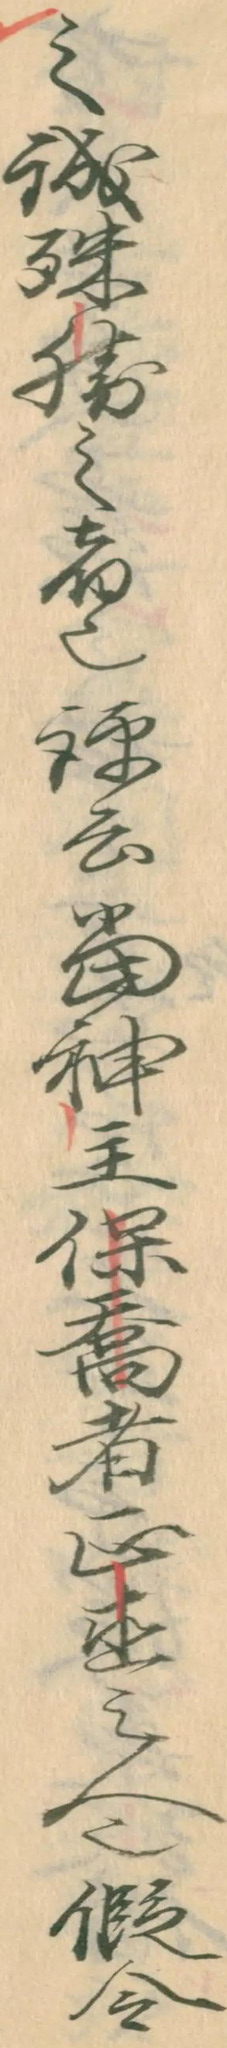之誠殊-勝之者也評云当神_主保喬者正-直之人也仮令
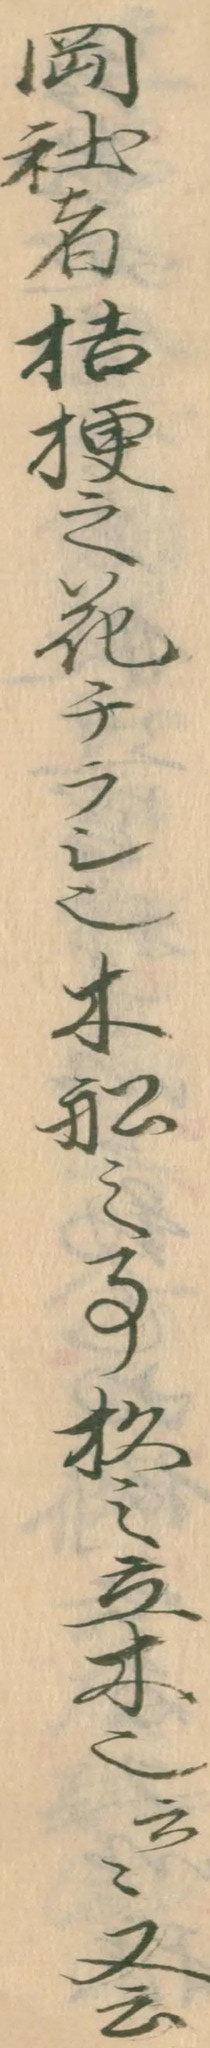岡社者桔梗之花チラシ也木船之事杉之立木也云々又云
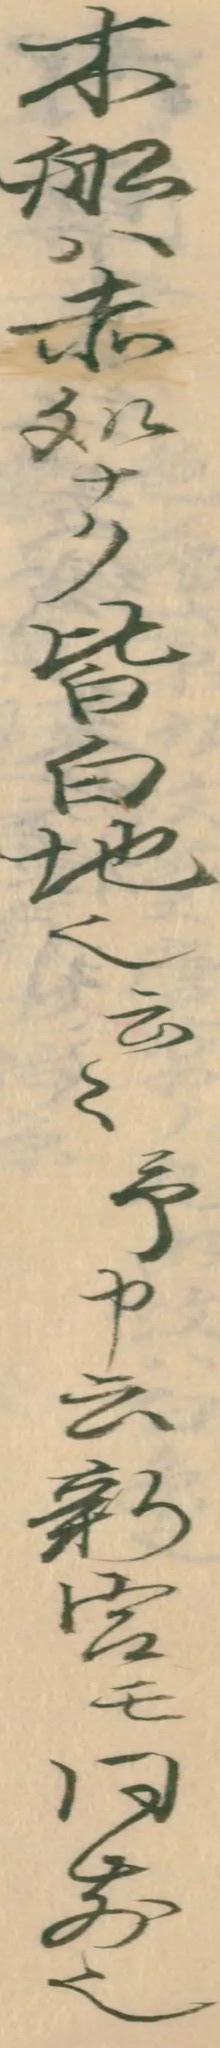木船ハ赤処ナク皆白地也云々予申云新宮モ同前也

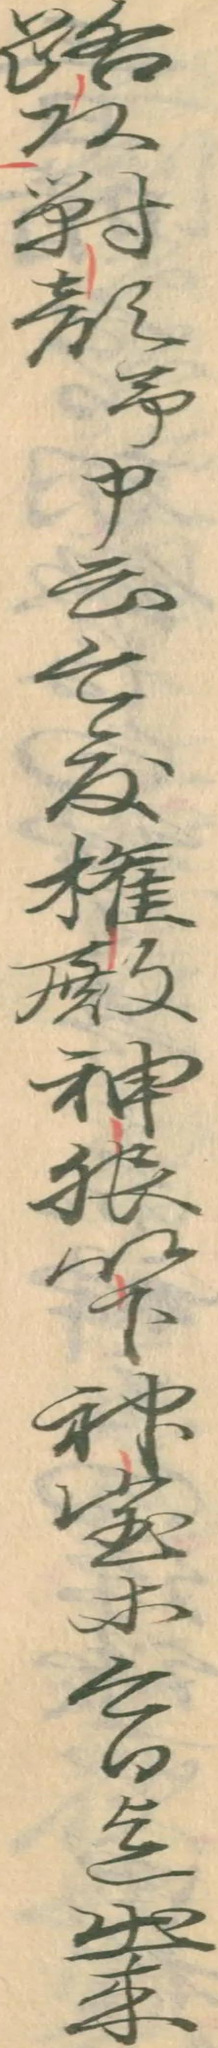路-頭対-顔予申云今度権-殿神-服以-下神-宝等今日迄出来
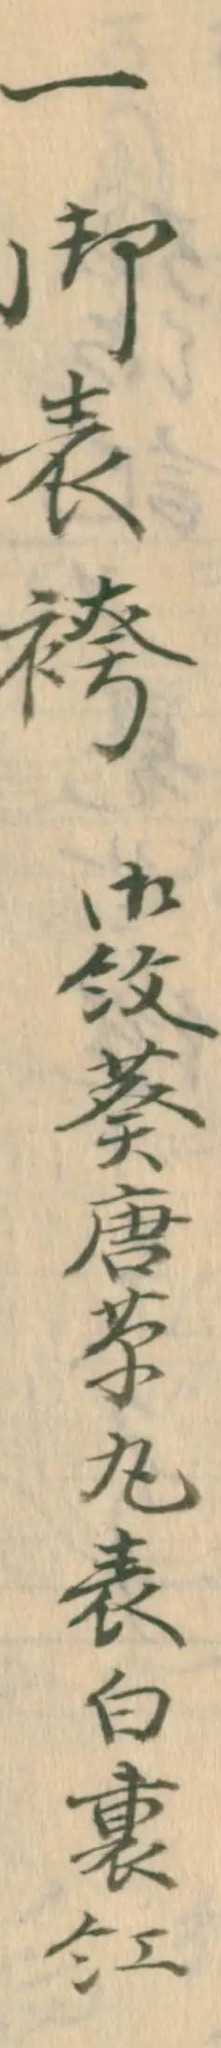一御表袴御紋葵唐草丸表白裏紅
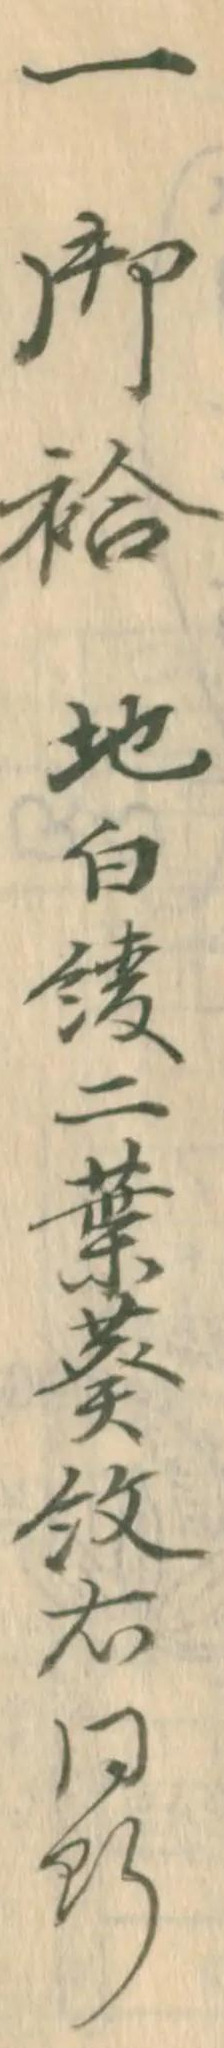一御袷地白綾二葉葵紋右同断

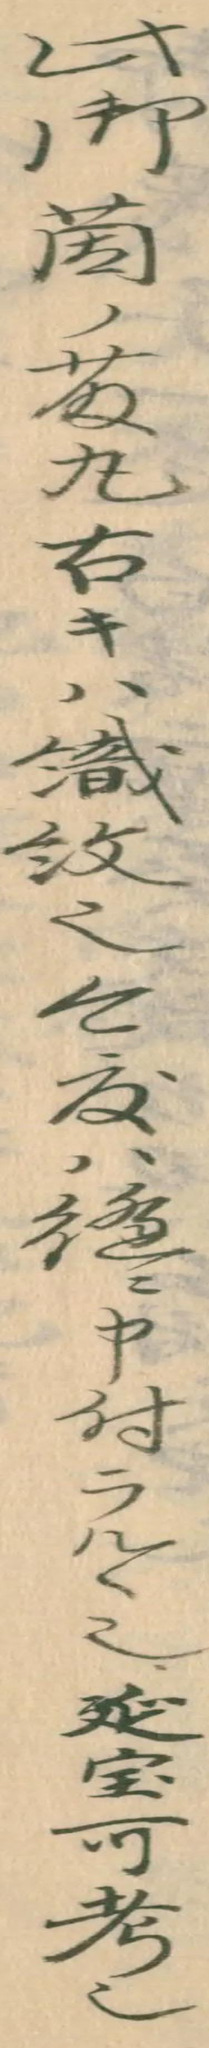此御茵ノ藤丸古キハ織紋也今度ハ縫ニ申付ラルヽ也延宝可考也
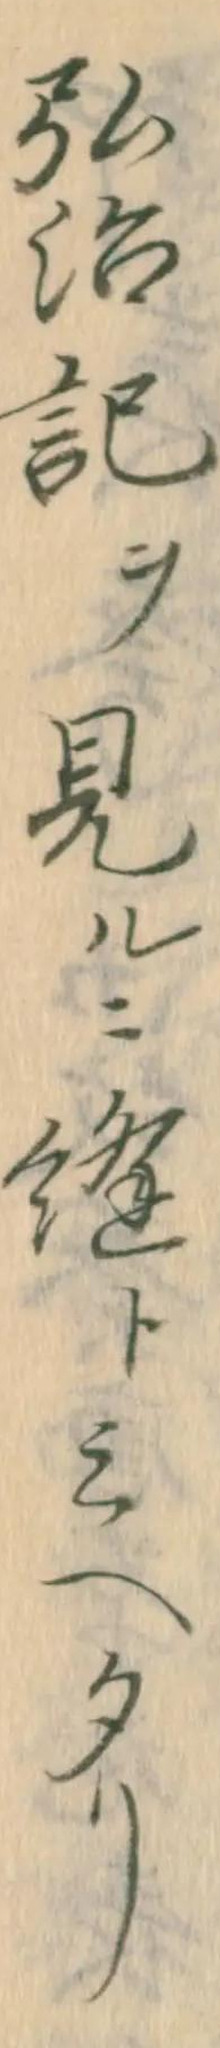弘治記ヲ見ルニ縫ト云ヘタリ
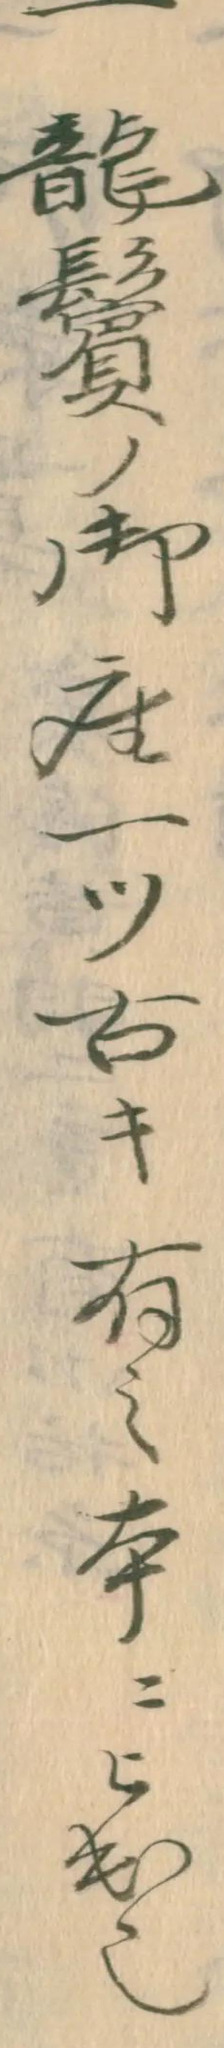一龍鬢ノ御座一ツ古キ有之本ニ被出也
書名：賀茂社記録. 第15冊
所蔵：国立国会図書館 National Diet Library, JAPAN
